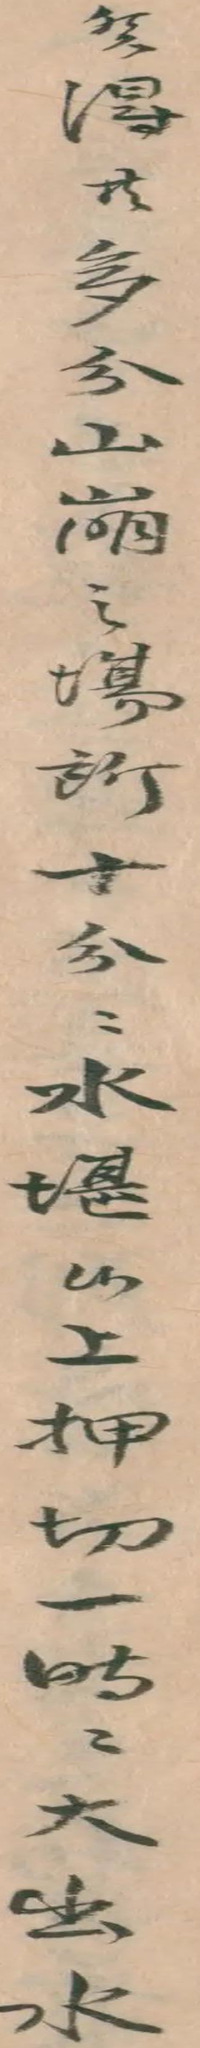候得共多分山崩之場所十分ニ水湛候上押切一時二大出水
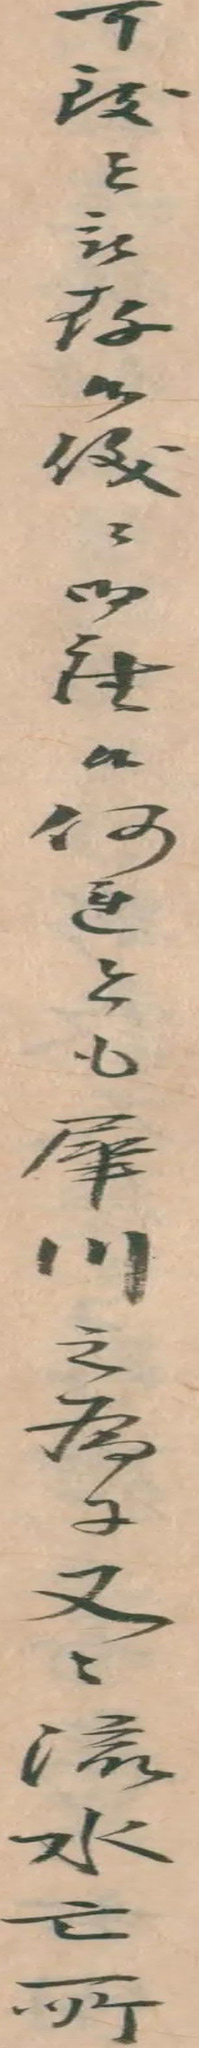可致と被存候儀二御座候何れとも犀川之為に又々流水亡所
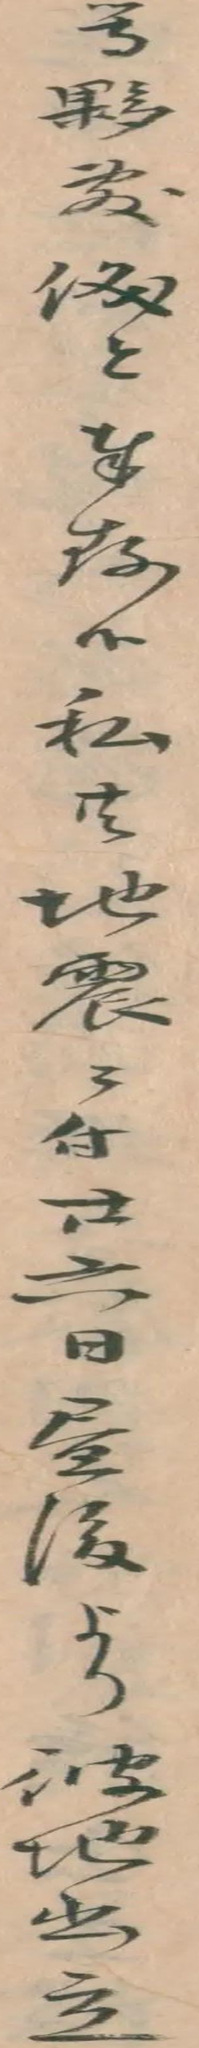等夥敷義と奉存候私共地震二付廿六日昼後より彼地出立

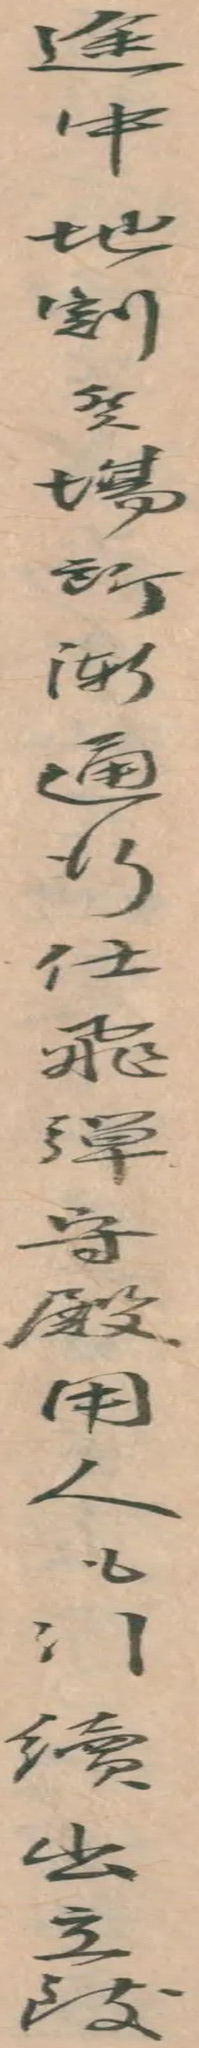途中地割候場所漸通行仕飛騨守殿用人も引続出立致
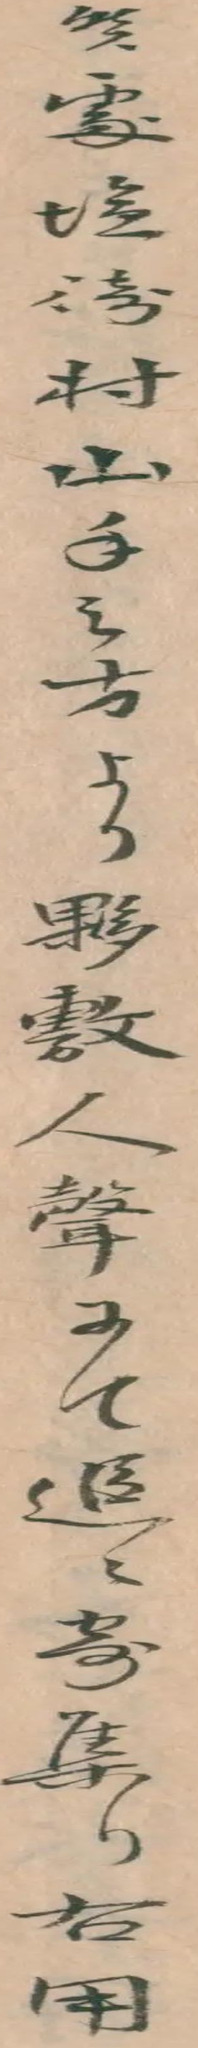候処塩崎村山手之方より夥敷人声にて追々寄集り右用
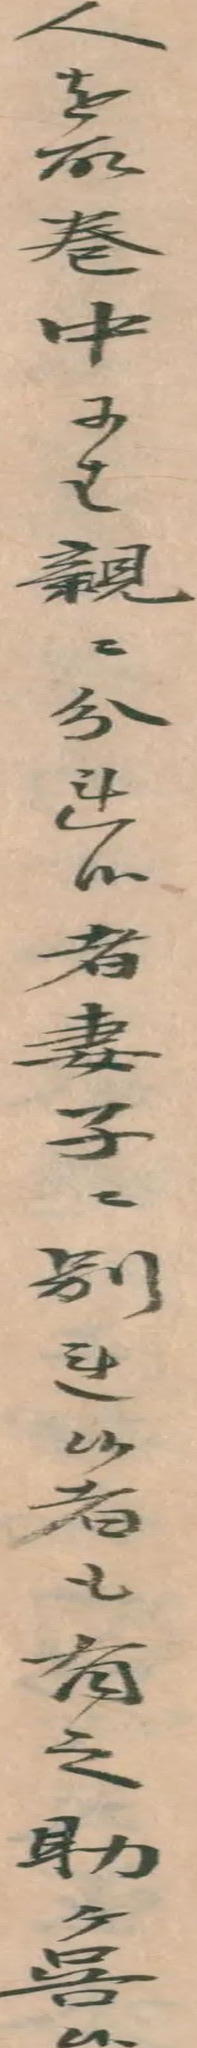人を取巻中にも親ニ別れ候者妻子ニ分れ候者も有之助ケ呉候
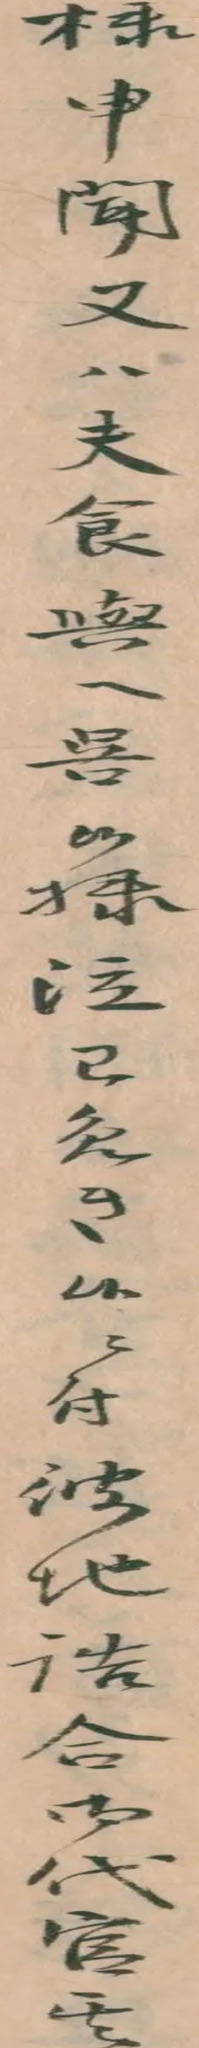様申聞又ハ夫食与へ呉候様泣わめき候二付彼地詰合代官其
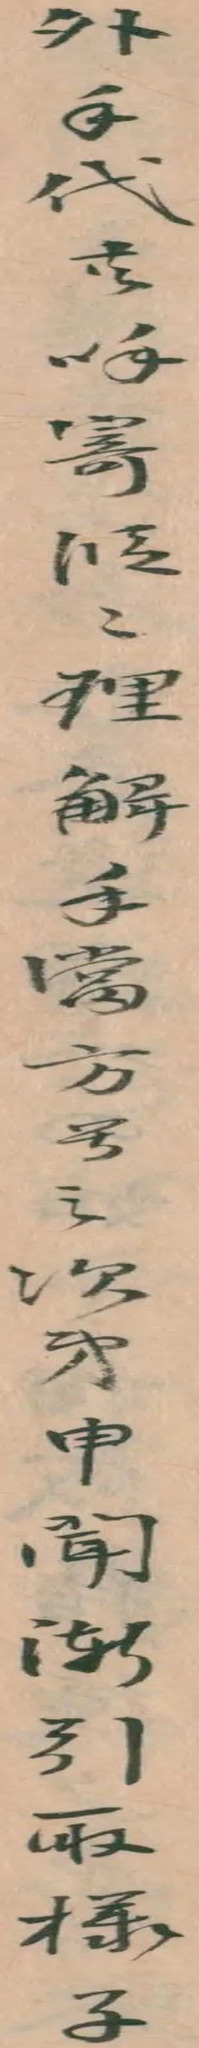外手代共呼寄段々理解手当方等之次第等申聞漸引取様子
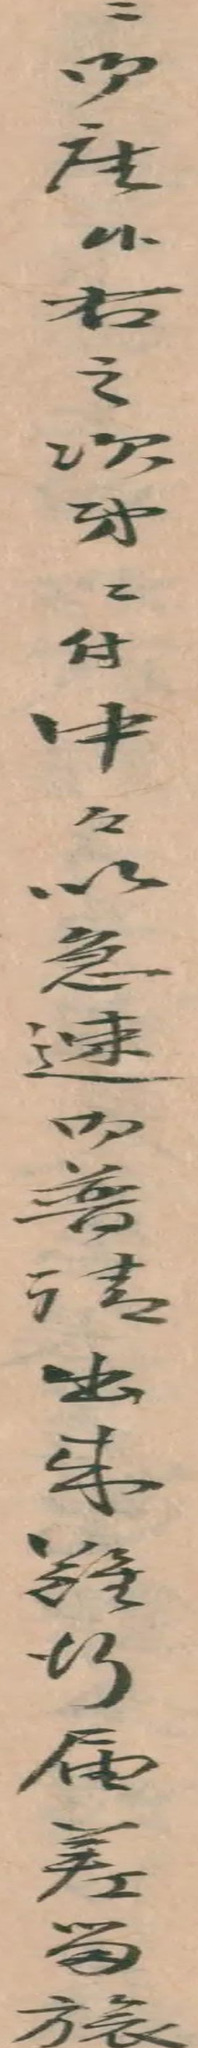ニ御座候右之次第二付中々以急速御普請出来難行届差当旅
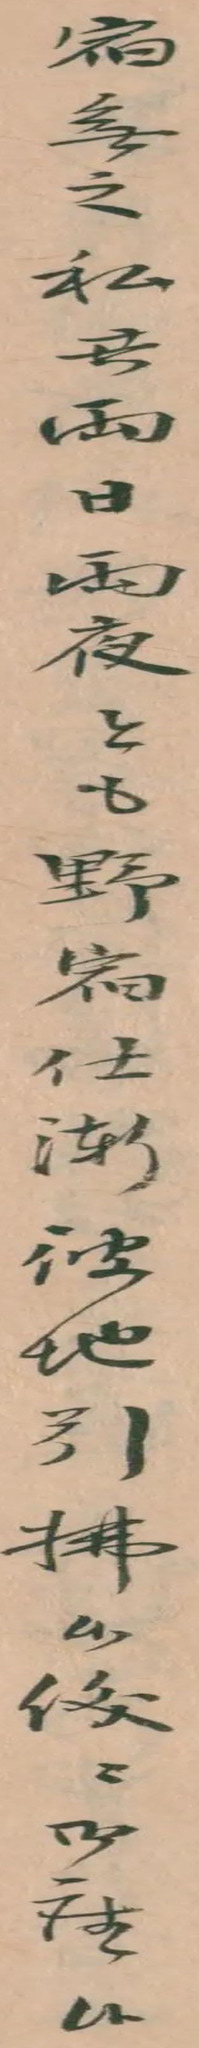宿無之私共両日両夜とも野宿仕漸彼地引払候儀二御座候
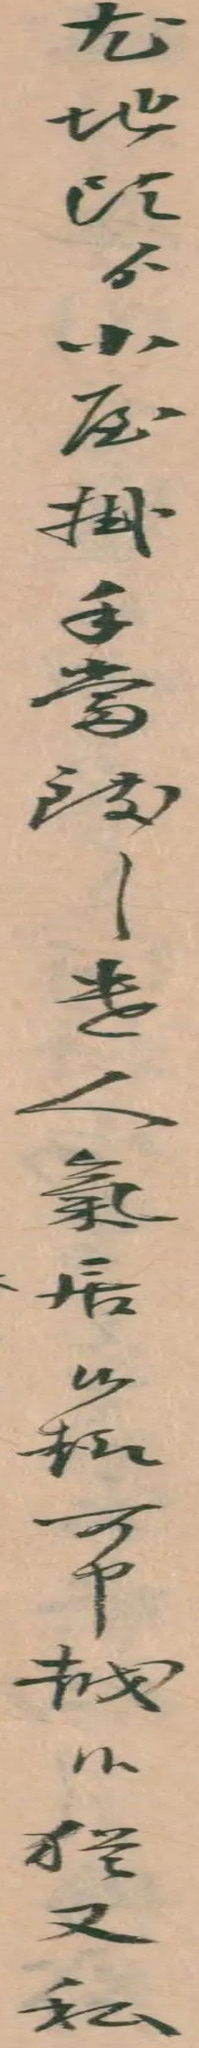尤地頭ゟ小屋掛手当致し遣人気居候様可申越候猶又私
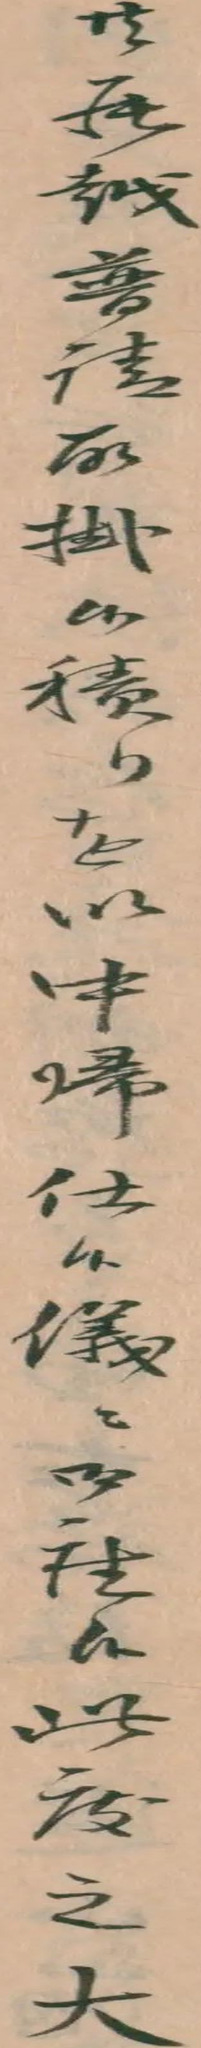共罷越普請取懸候積りを以中帰仕候儀ニ御座候此度之大
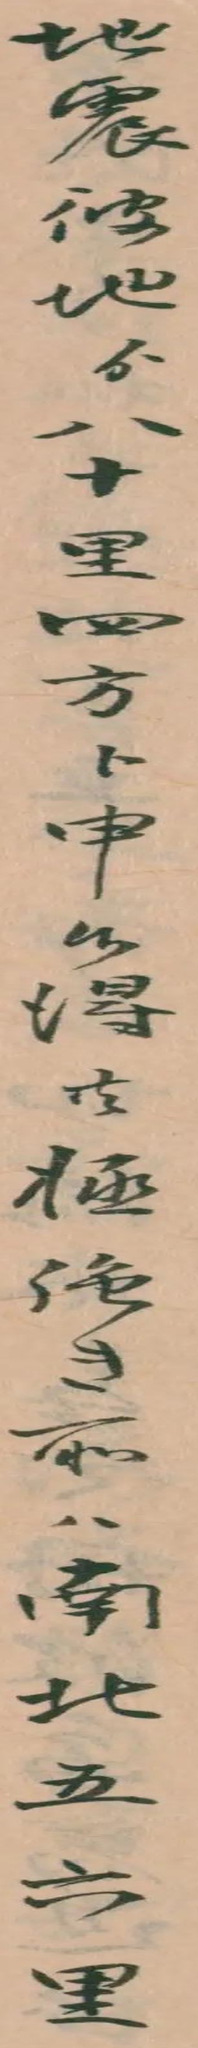地震彼地ゟハ十里四方ト申候得共極強き所ハ南北五六里
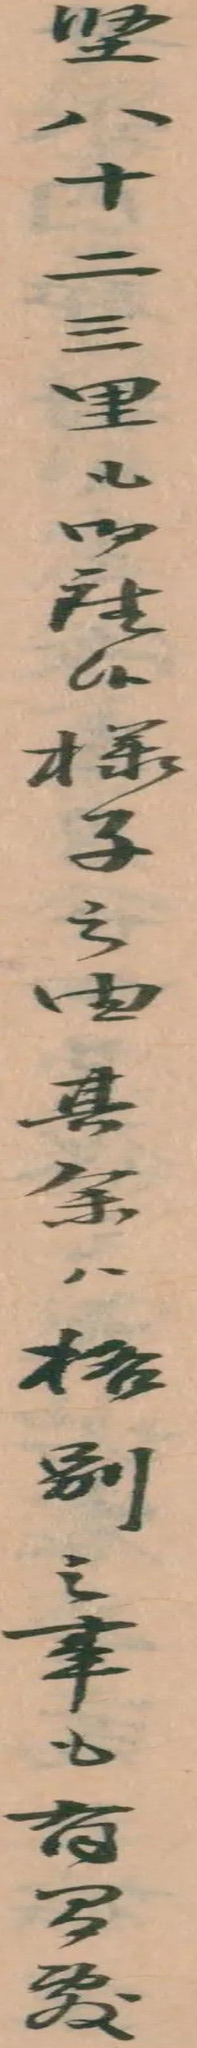竪ハ十二三里も御座候様子之由其余ハ格別之事も有間敷
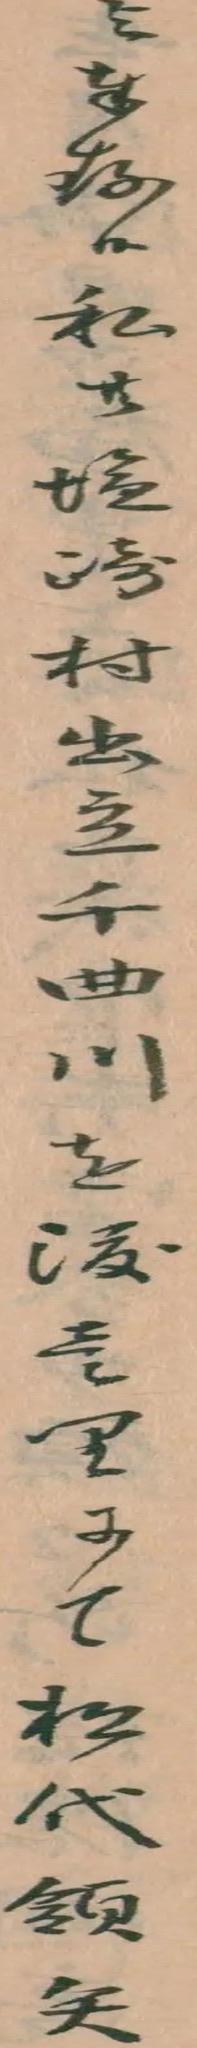と奉存候私共塩崎村出立千曲川を渡壱里にて松代領矢
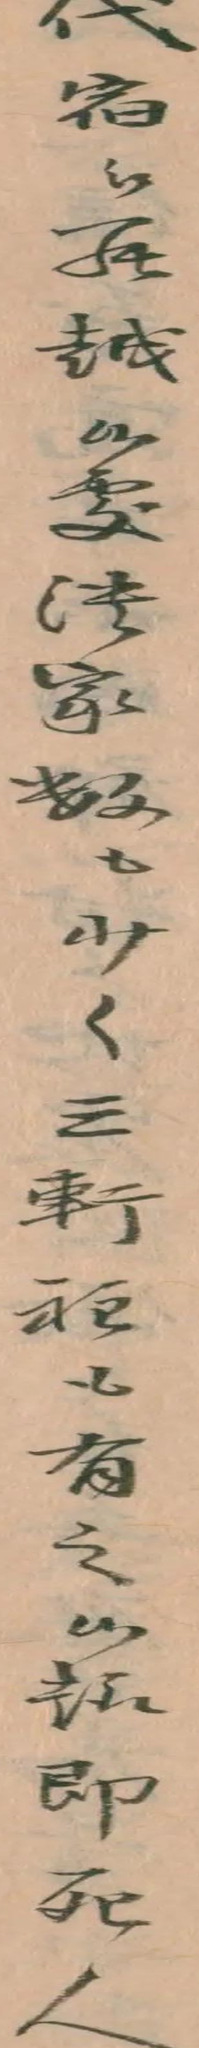代宿江罷越候処潰家数も少く三軒程も有之候趣即死人
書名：地災撮要. 巻3(地震之部)-巻4(噴火之部)
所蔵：国立国会図書館 National Diet Library, JAPAN
